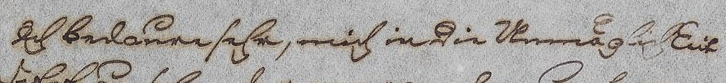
Ich bedaure sehr, mich in die Unmöglichkeit
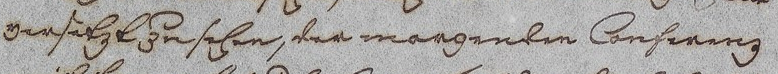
versetzt zu sehen, der morgenden Conferenz
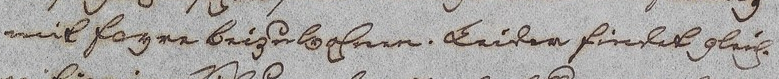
mit Favre beizuwohnen. Leider findet gleich-
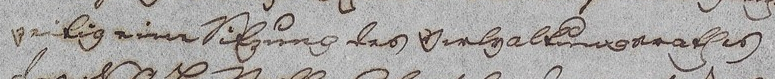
zeitig eine Sitzung des Verwaltungsrathes
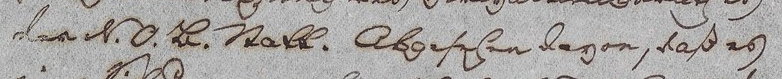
der N.O.B. Statt. Abgesehen davon, daß es
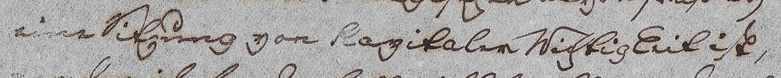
eine Sitzung von kapitaler Wichtigkeit ist,
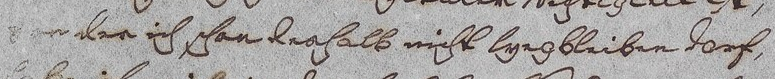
von der ich schon deshalb nicht wegbleiben darf,
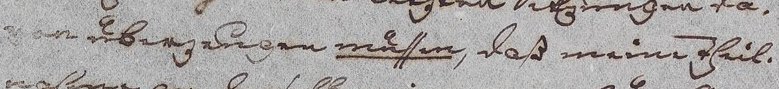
von überzeugen müssen, daß meine Theil-
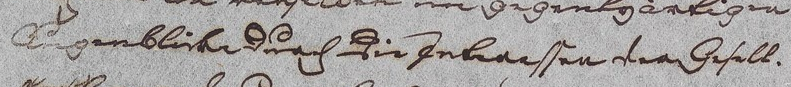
Augenblicke durch die Interessen der Gesell-
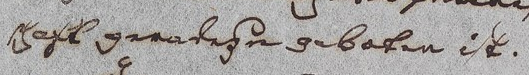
schaft geradezu geboten ist.
